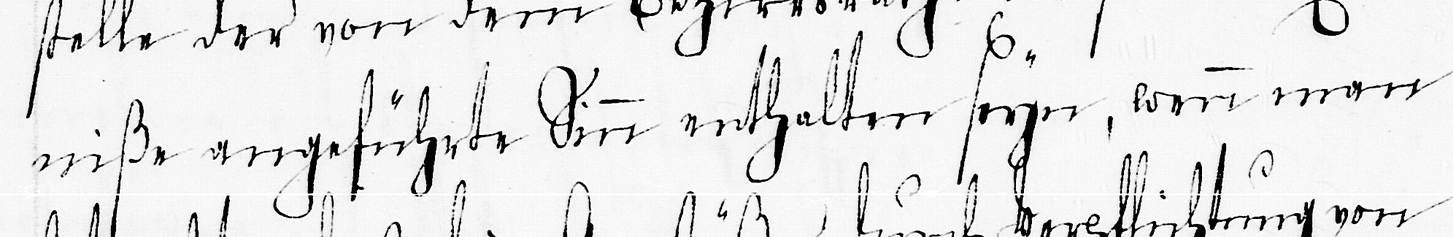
niße angeführte Sinn enthalten seyn, wenn man
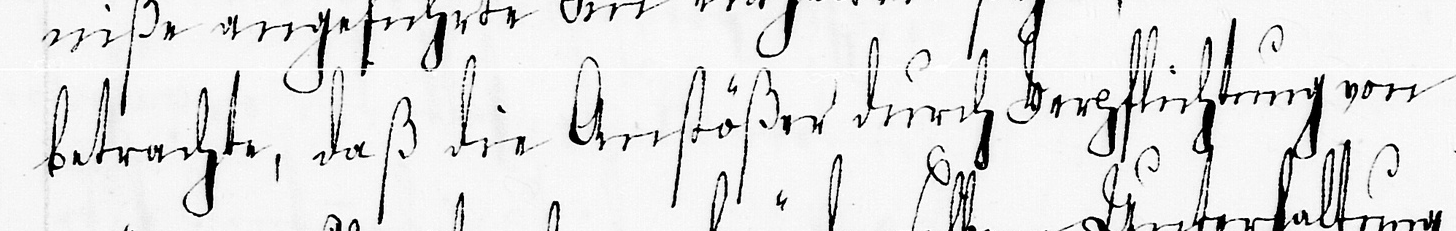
betrachte, daß die Anstößer durch Verpflichtung von
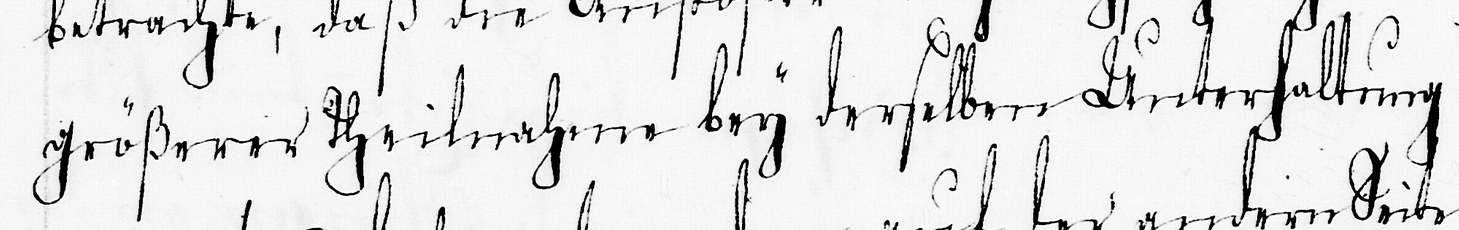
größerer Theilnahme bey derselben Unterhaltung
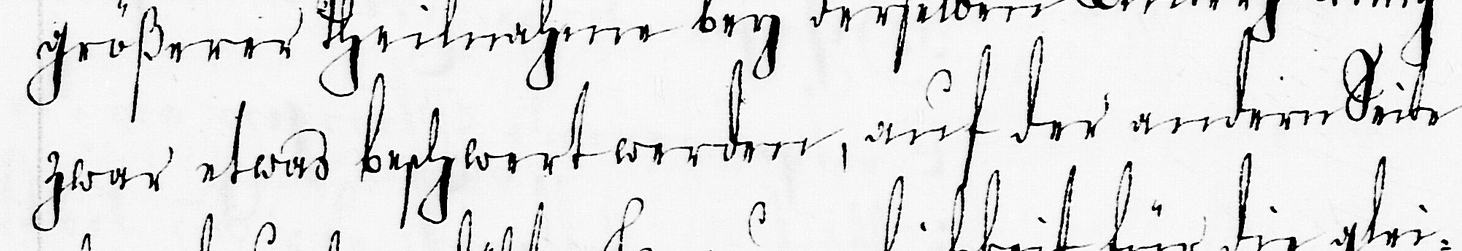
zwar etwas beschwert werden, auf der andern Seite
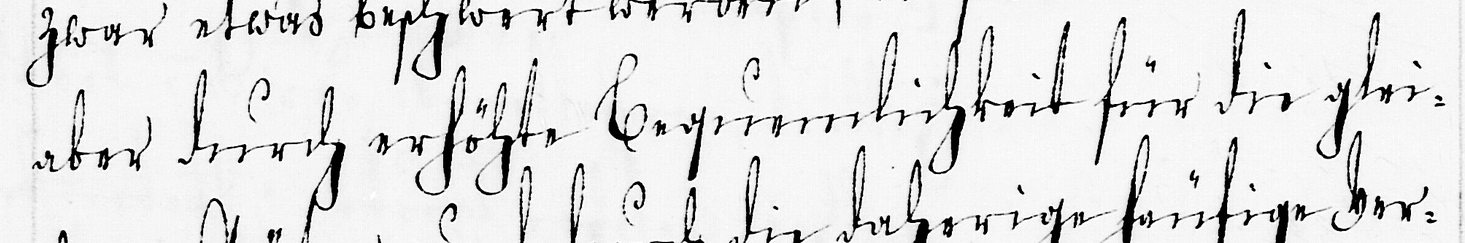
aber durch erhöhte Bequemlichkeit für die glei¬
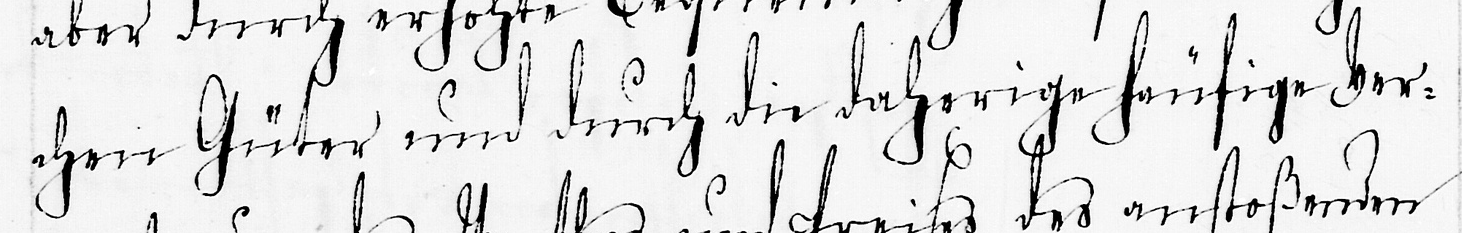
chen Güter und durch die daherige häufige Ver¬
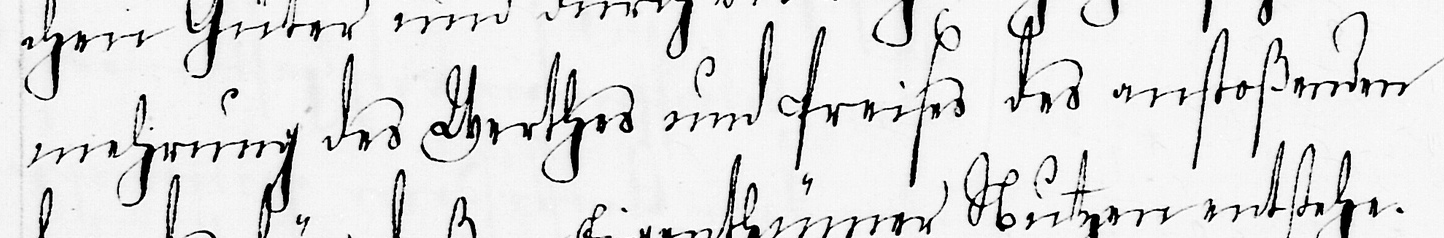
mehrung des Werthes und Preises des anstoßenden
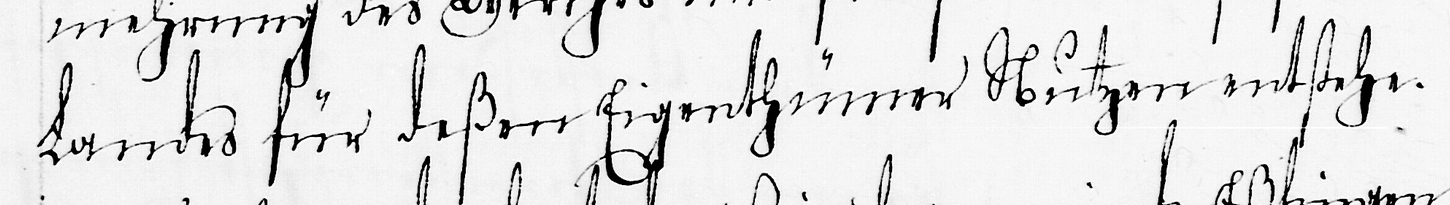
Landes für deßen Eigenthümer Nutzen entstehe.
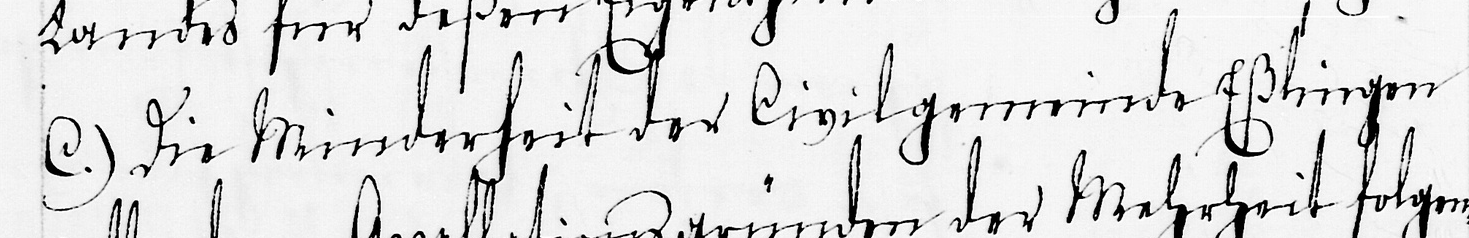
C.) Die Minderheit der Civilgemeinde Eßlingen
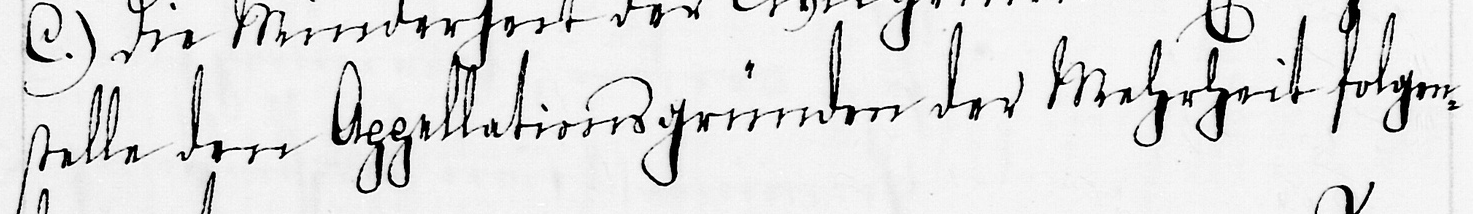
stelle den Appellationsgründen der Mehrheit folgen¬
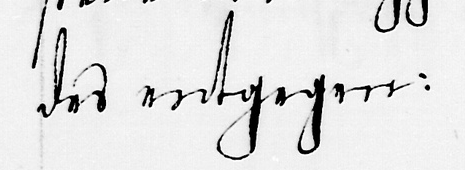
des entgegen:
